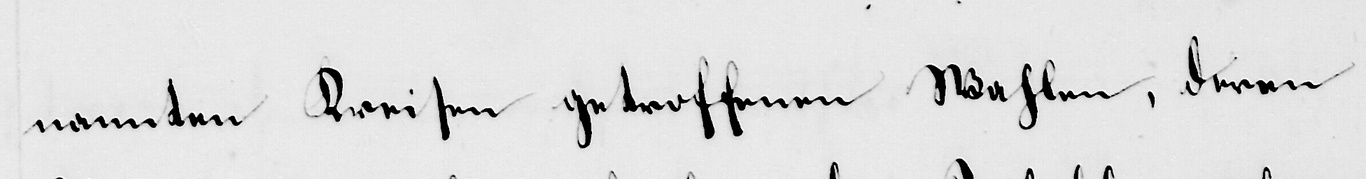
nannten Kreisen getroffenen Wahlen, deren
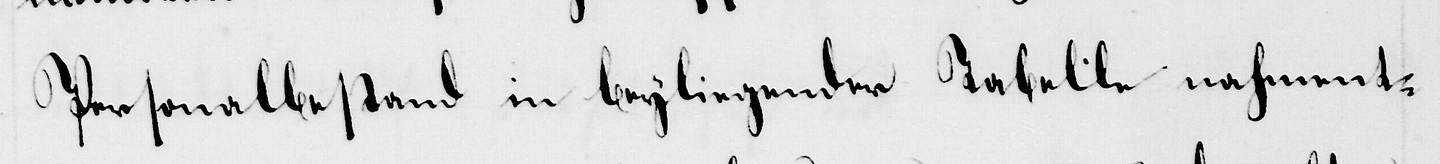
Personalbestand in beyliegender Tabelle nahment¬
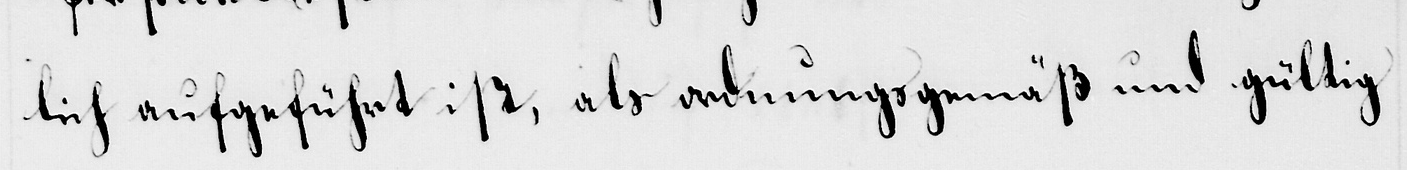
lich aufgeführt ist, als ordnungsgemäß und gültig
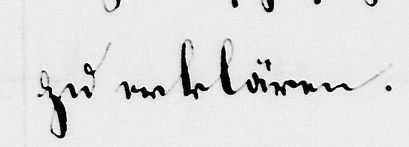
zu erklären.
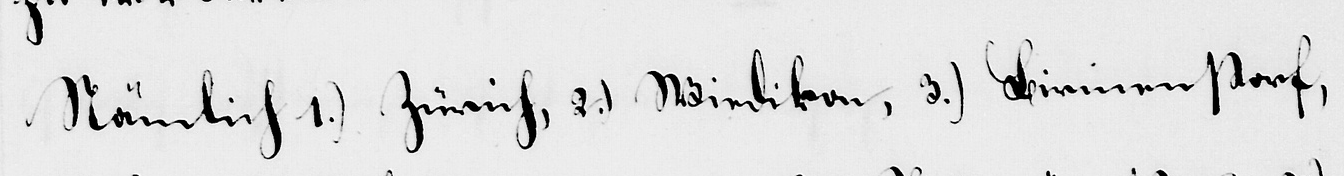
Nämlich 1.) Zürich, 2.) Wiedikon, 3.) Birmensdorf,
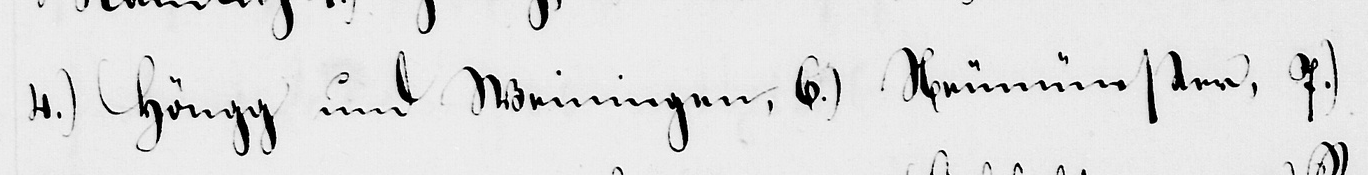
4.) Höngg und Weiningen, 6.) Neumünster, 7.)
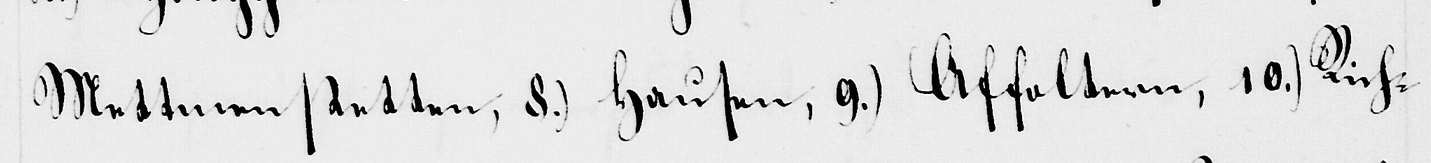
Mettmenstetten, 8.) Hausen, 9.) Affoltern, 10.) Rich¬
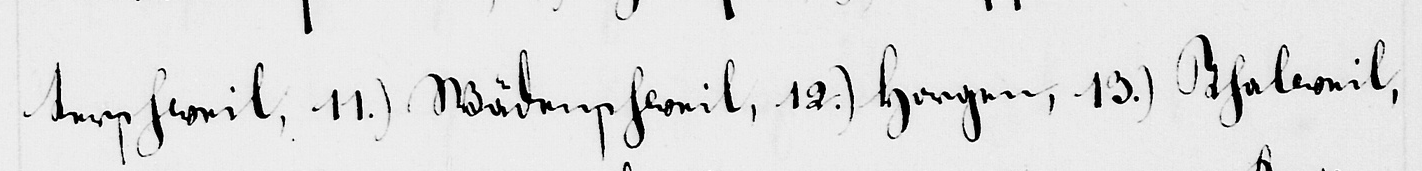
terschweil, 11.) Wädenschweil, 12.) Horgen, 13.) Thalweil,
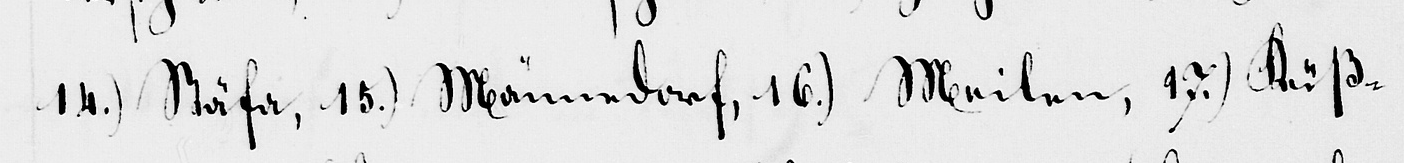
14.) Stäfa, 15.) Männedorf, 16.) Meilen, 17.) Küß¬
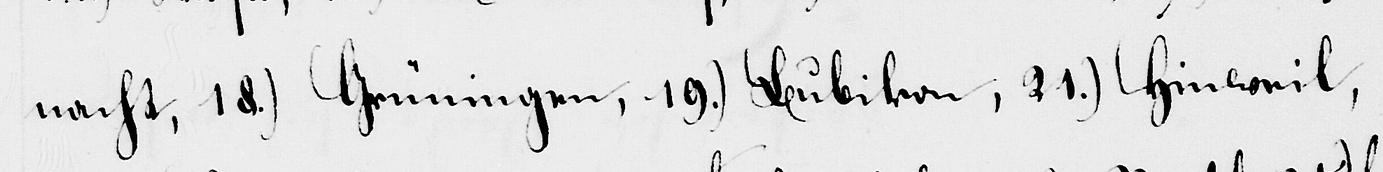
nacht, 18.) Grüningen, 19.) Bubikon, 21.) Hinweil,
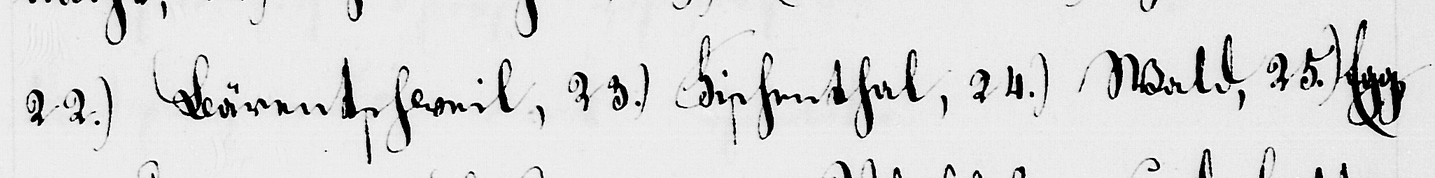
22.) Bärentschweil, 23.) Fischenthal, 24.) Wald, 25.) Egg,
